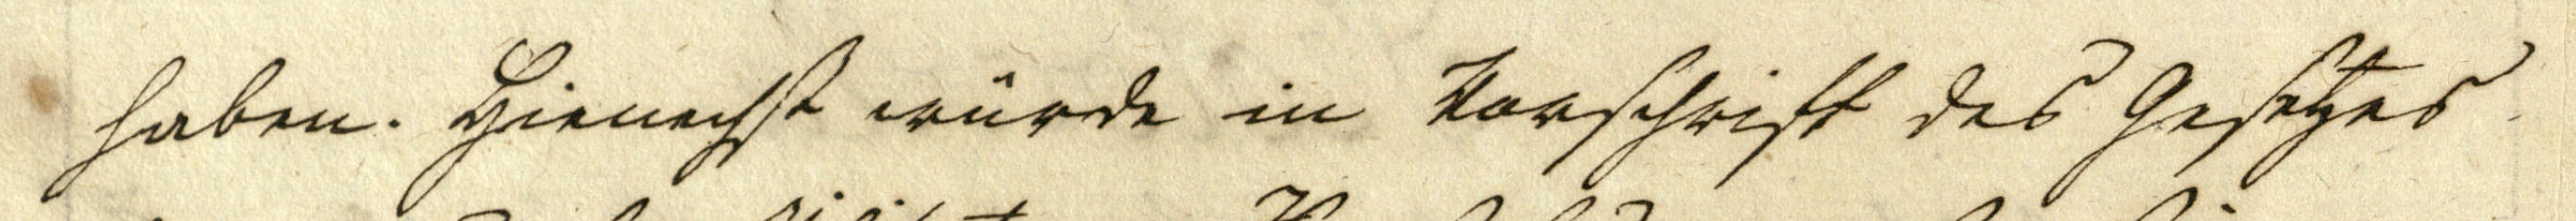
haben. Hienechst würde in Vorschrift des Gesetzes
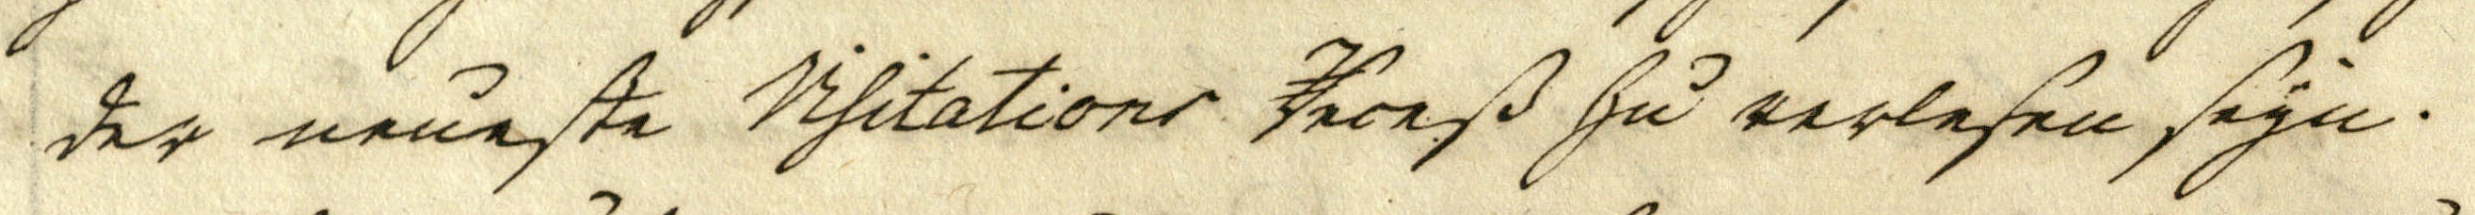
der neueste Visitations Receß zu verlesen seyn.
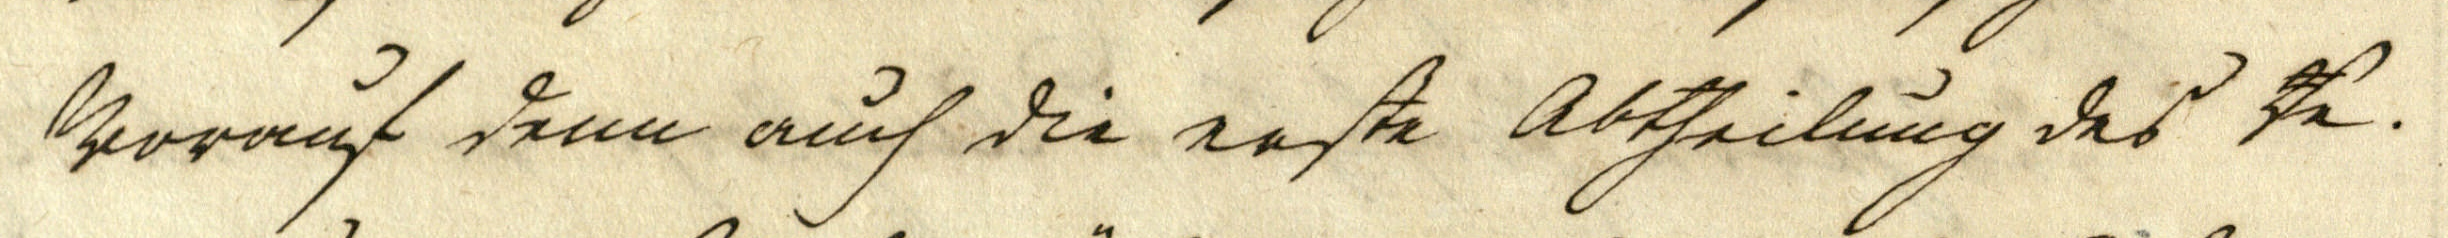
Worauf denn auch die erste Abtheilung des Re-
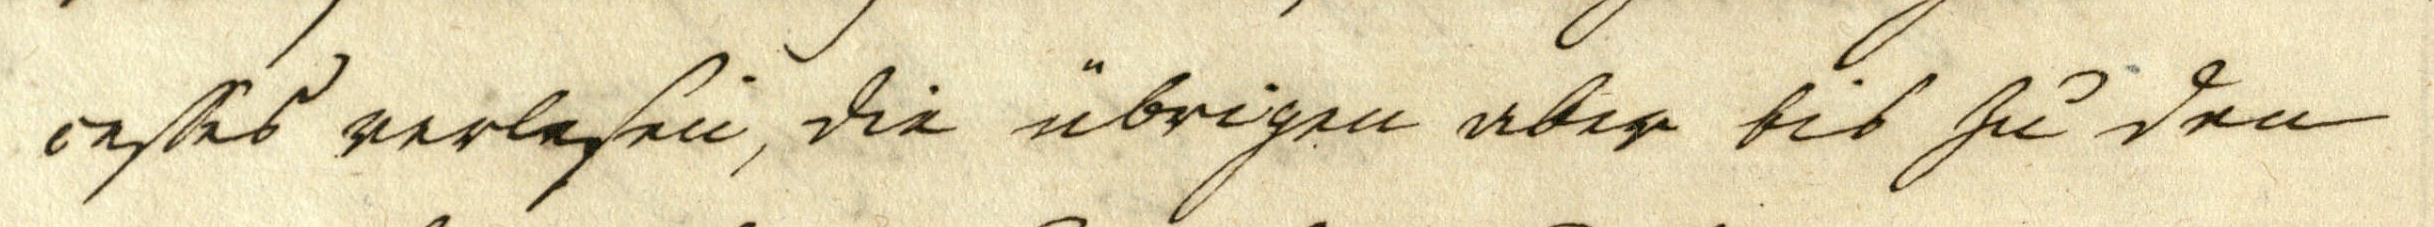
cesses verlesen, die übrigen aber bis zu den
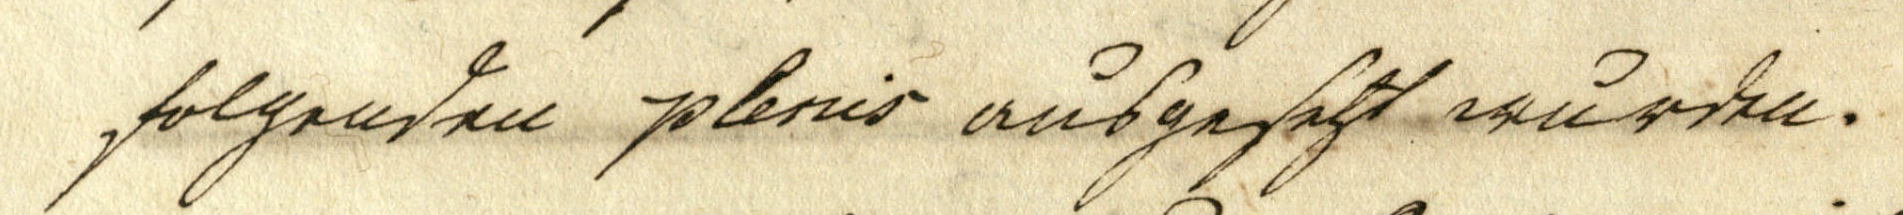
folgenden plenis ausgesetzt wurden.
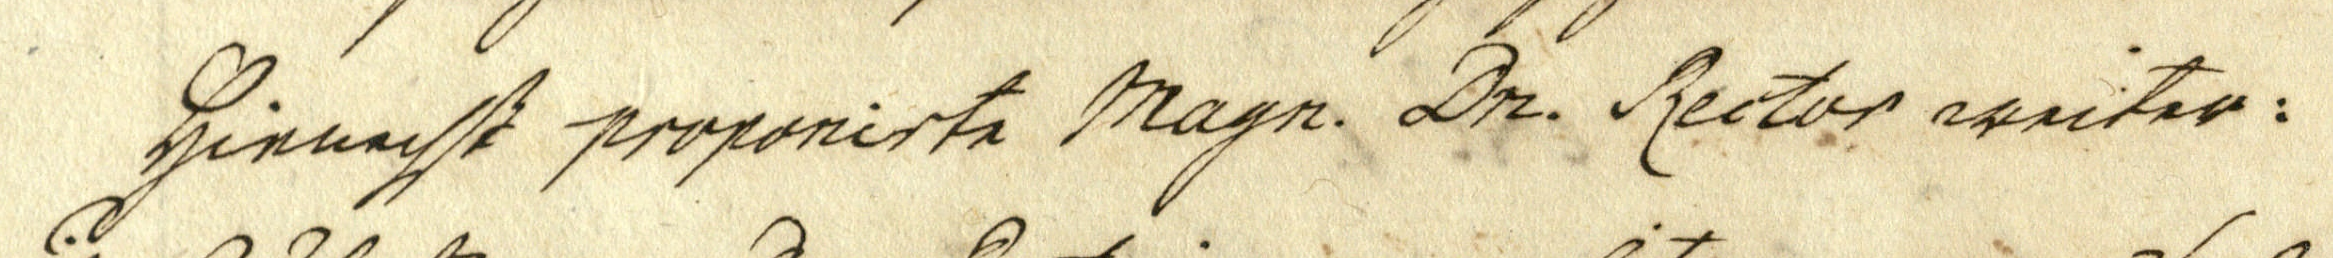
Hienechst proponirte Magn. Dn. Rector weiter:
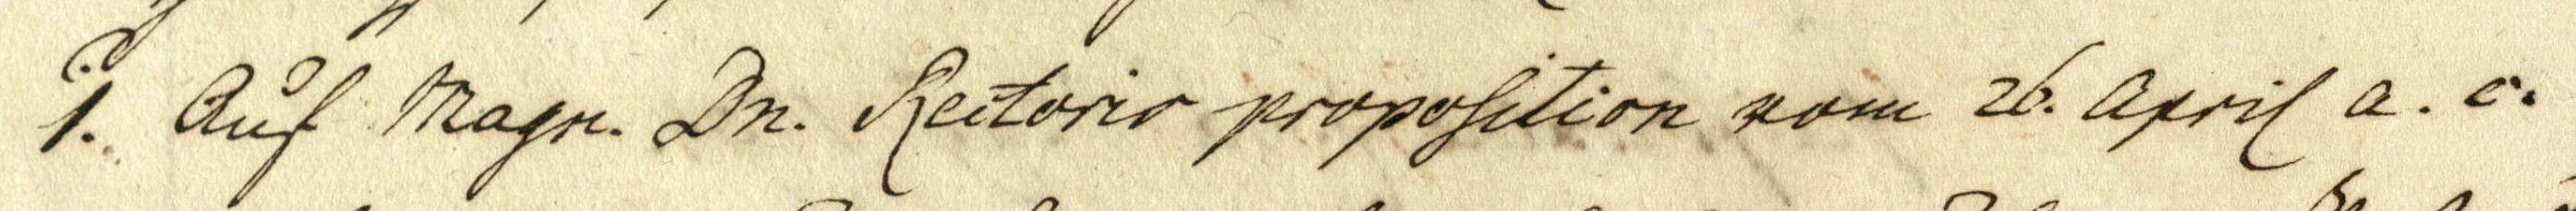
1. Auf Magn. Dn. Recotris proposition vom 26. April a. c.
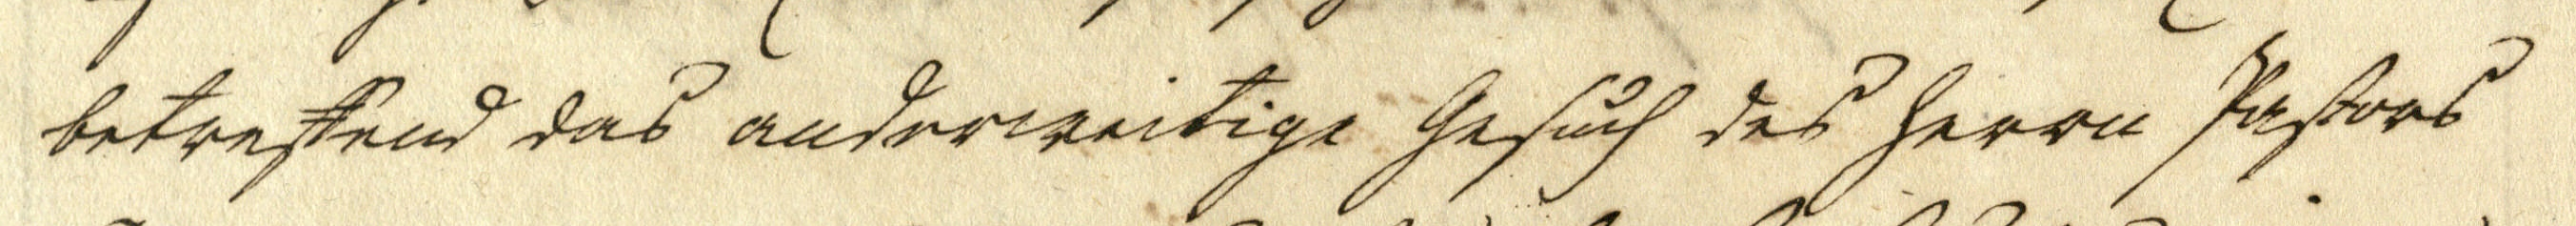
betreffend das anderweitige Gesuch des Herrn Pastors
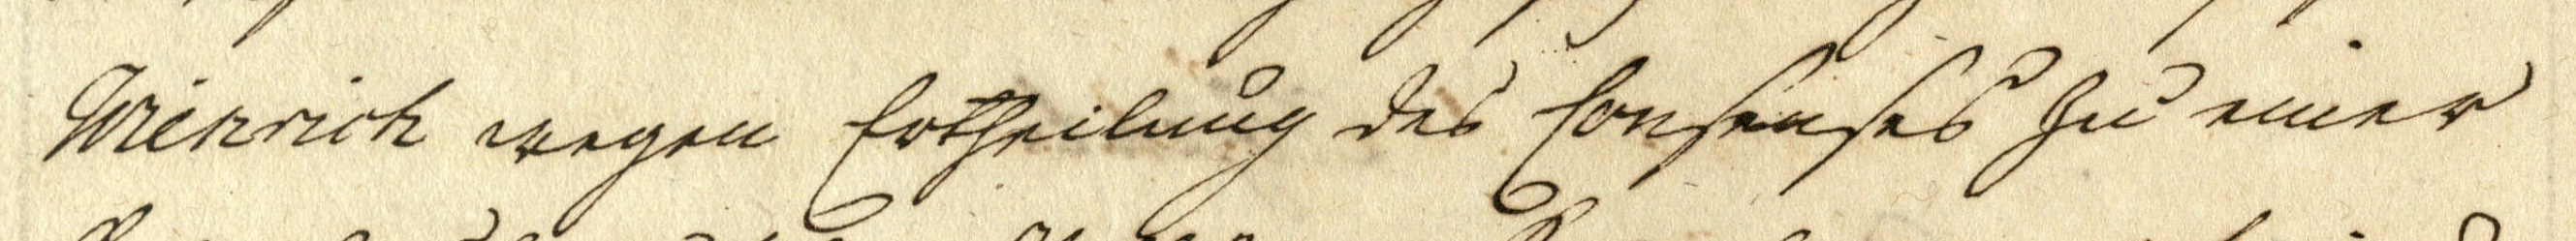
Wenrich wegen Ertheilung des Consenses zu einer
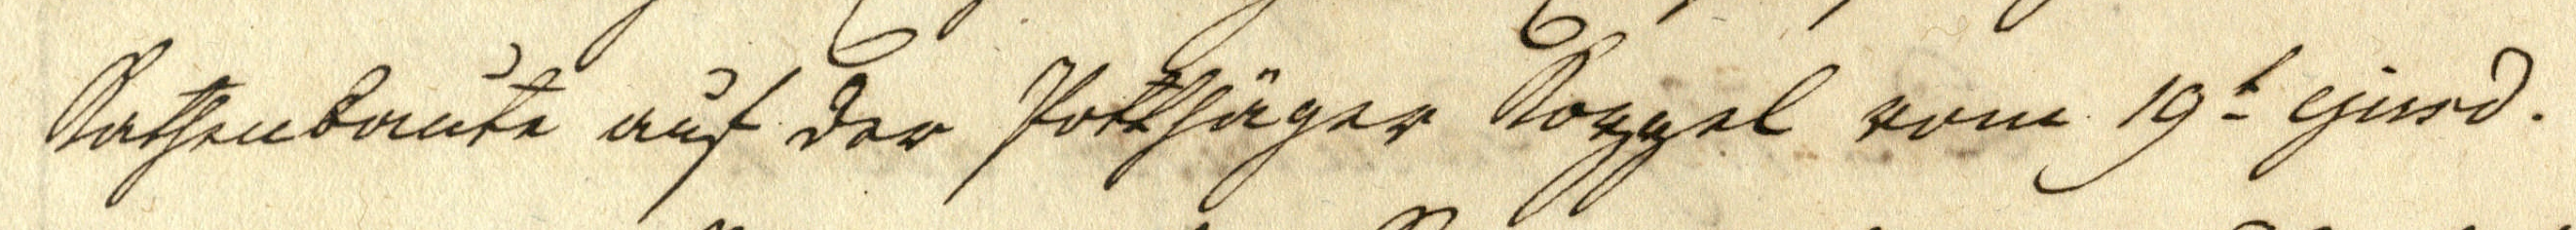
Kathenbaute auf der Potthäger Koppel vom 19t ejusd.
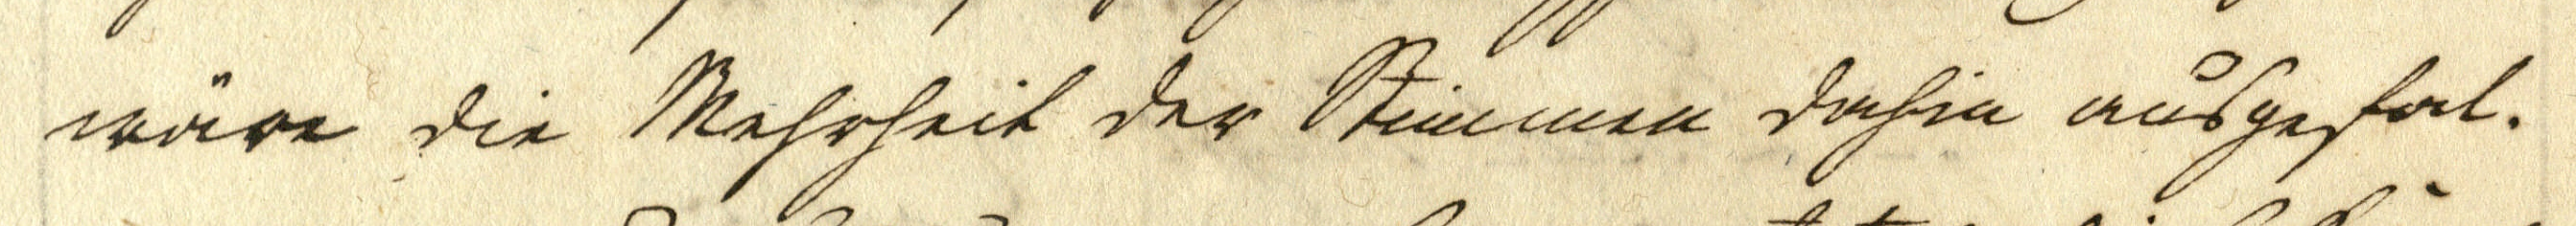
wäre die Mehrheit der Stimmen dahin ausgefal-
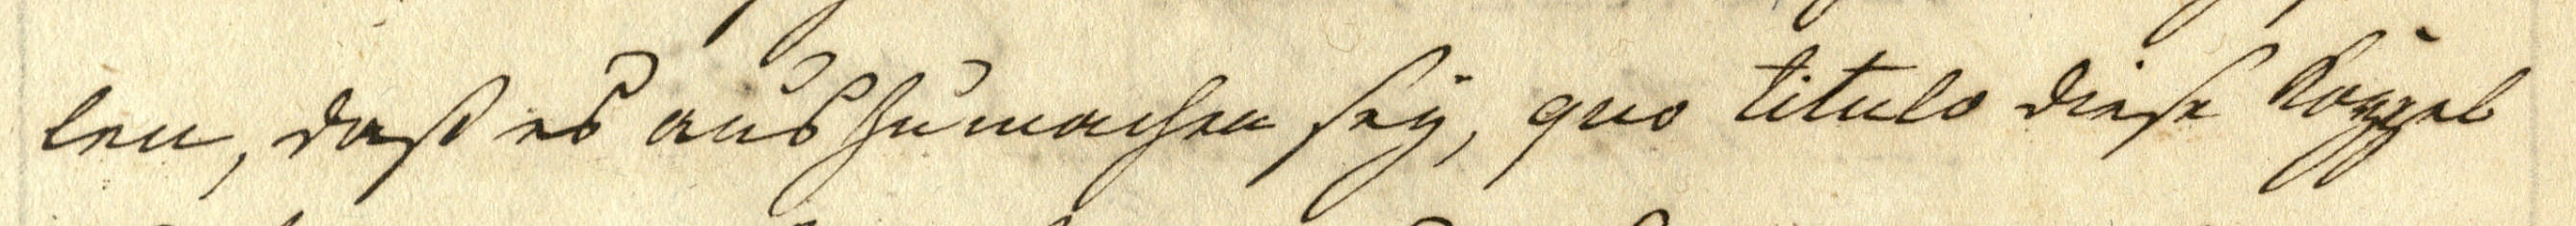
len, daß es auszumachen sey, quo titulo diese Koppel
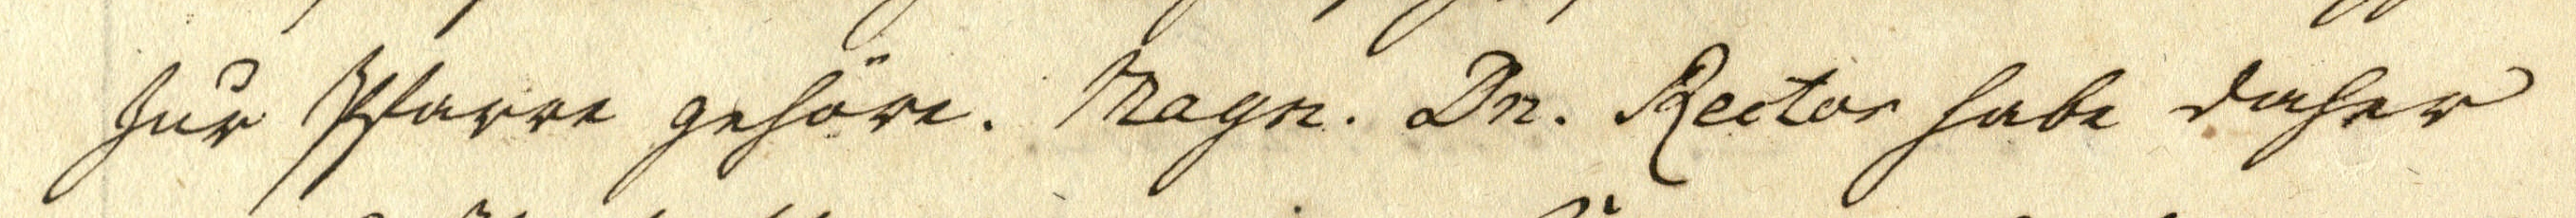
zur Pfarre gehöre. Magn. Dn. Rector habe daher
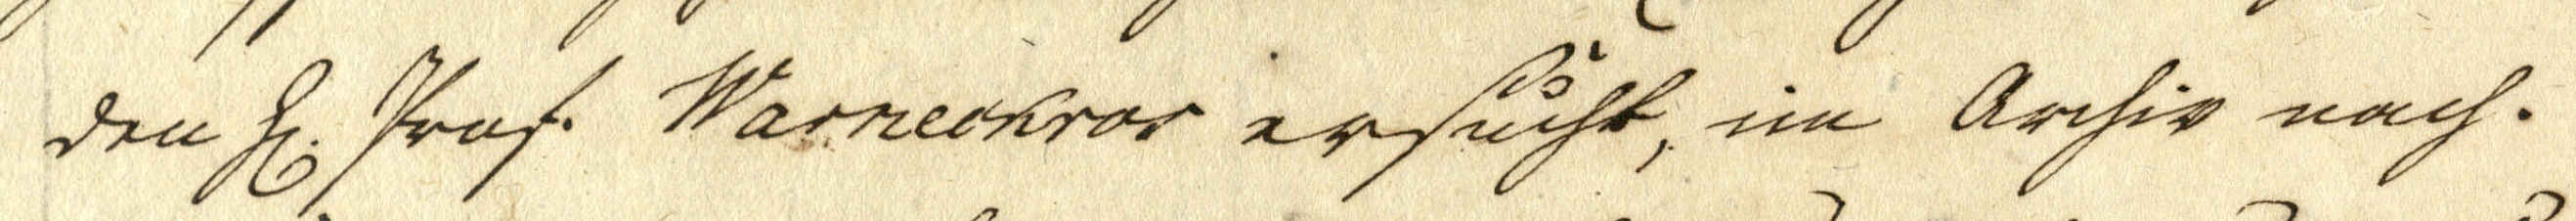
den H. Prof. Warneckros ersucht, im Archiv nach-
